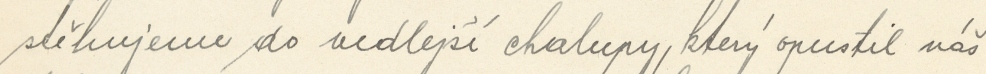stěhujeme do vedlejší chalupy, který opustil náš
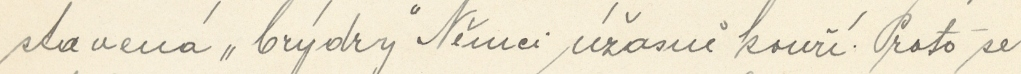stavená „brýdry“ Němci úžasně kouří. Proto se
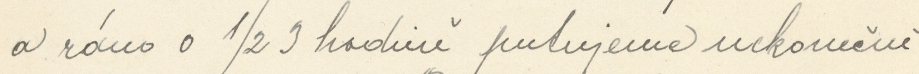a ráno o 1/2 3 hodině putujeme nekonečně
